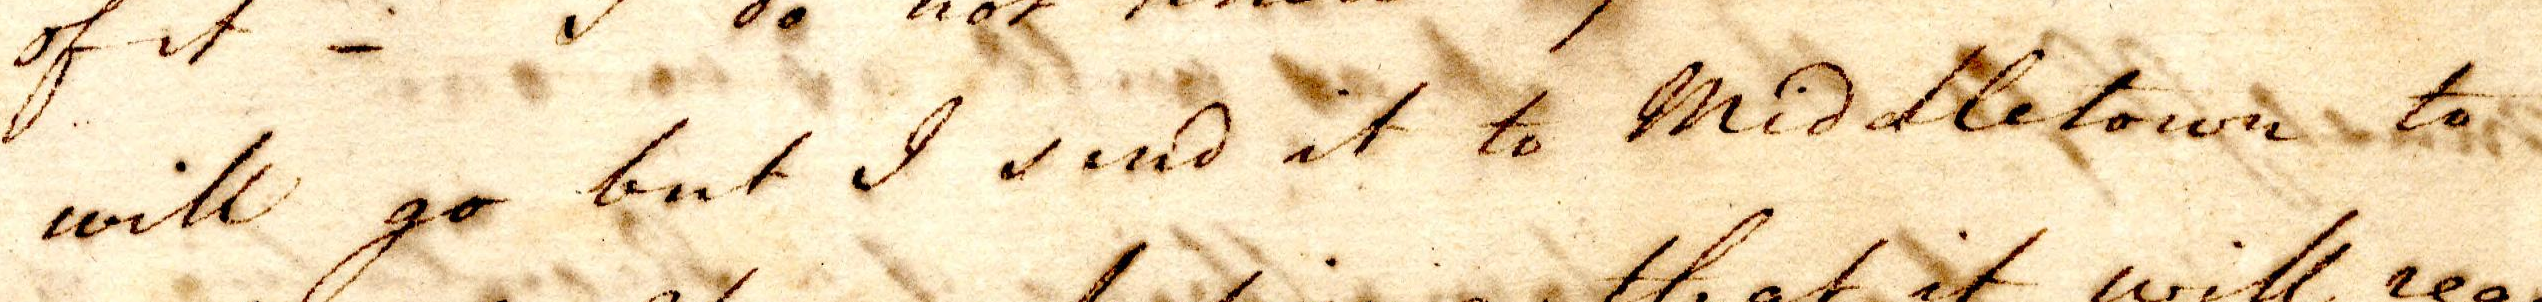will go but I send it to Middletown to
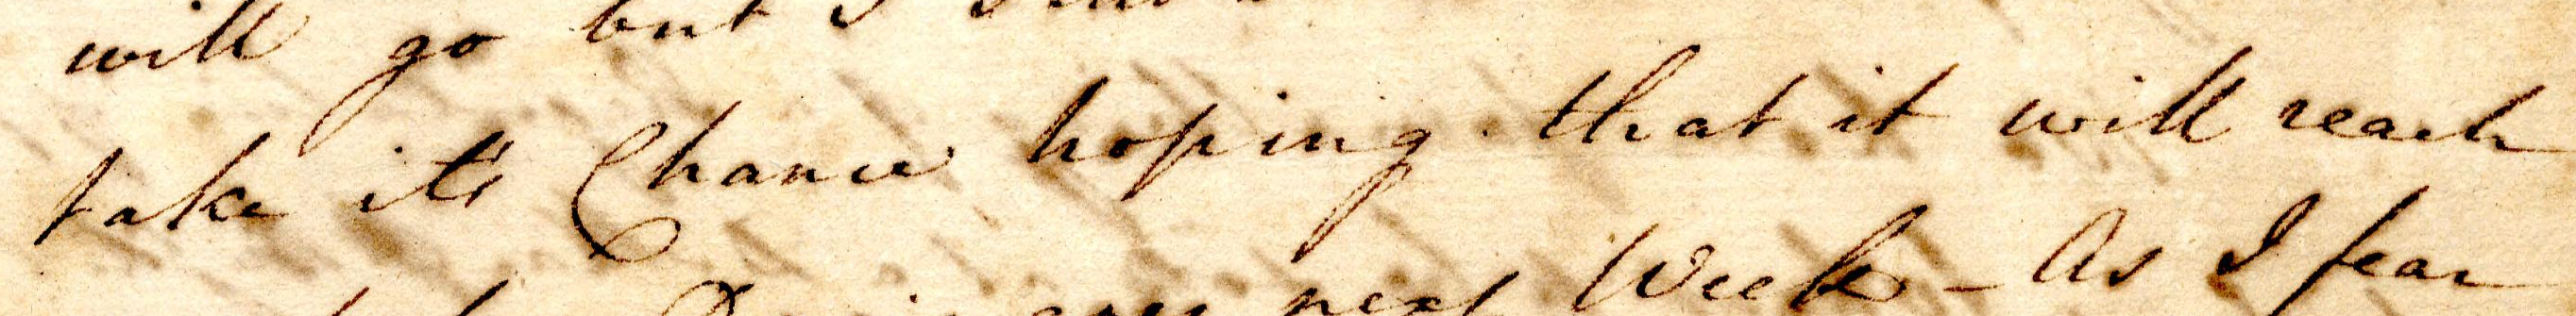take its Chance hoping that it will reach
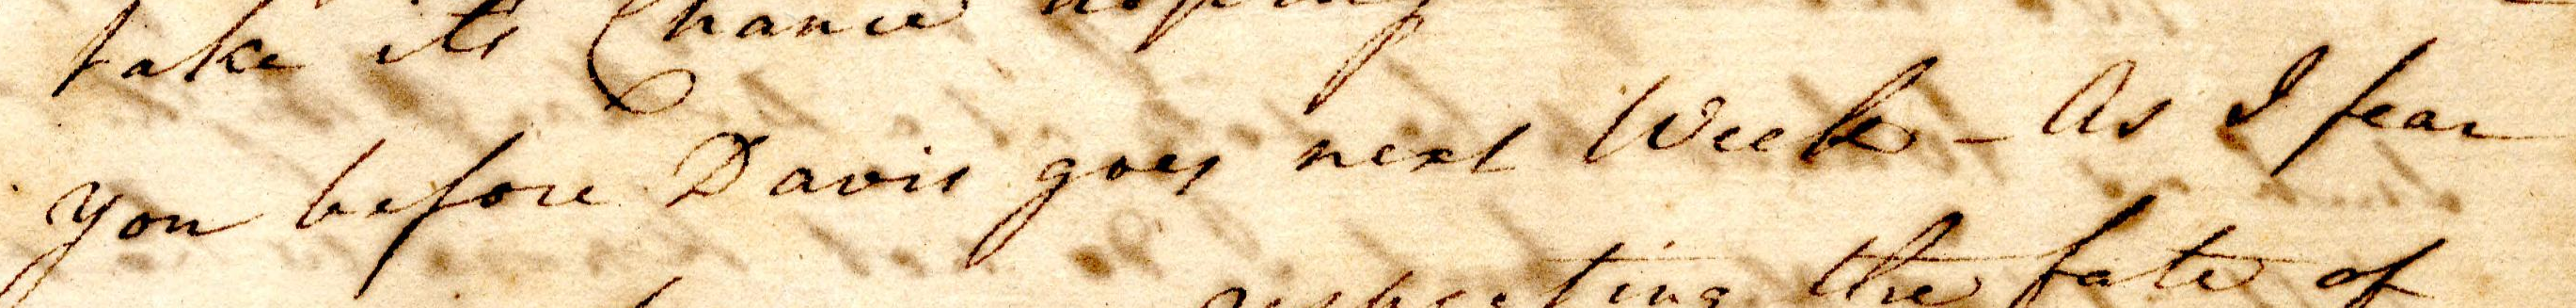you before Davis goes next Week. As I fear
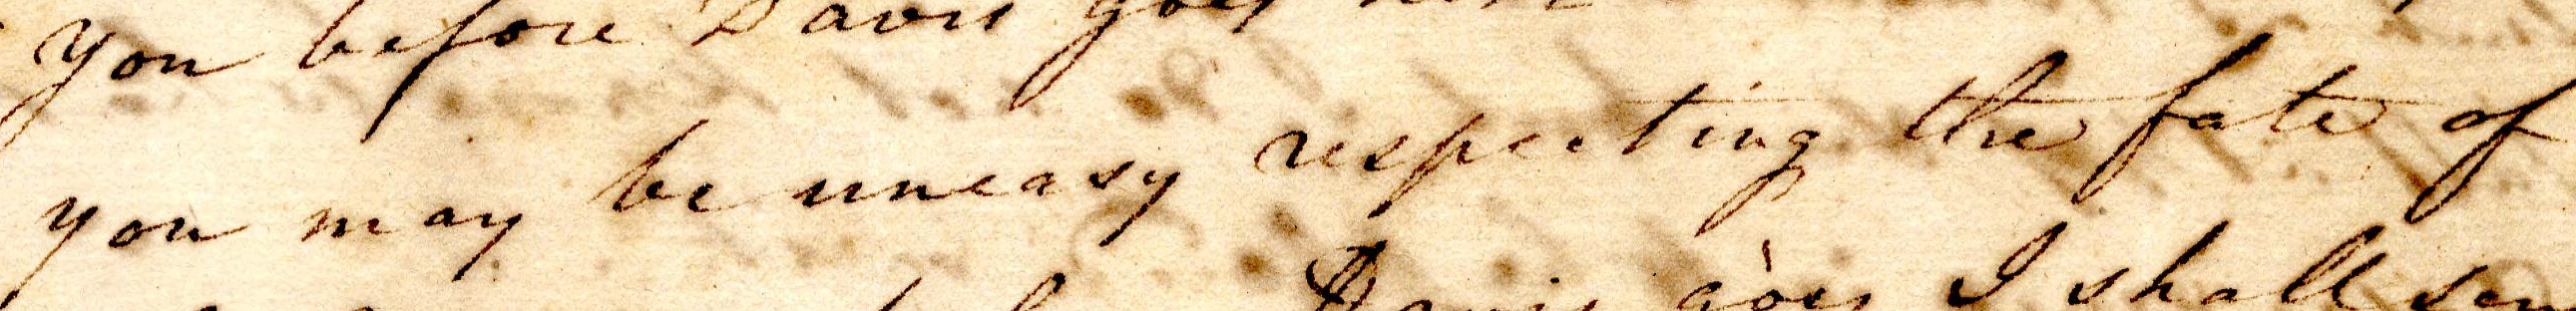you may be uneasy respecting the fate of
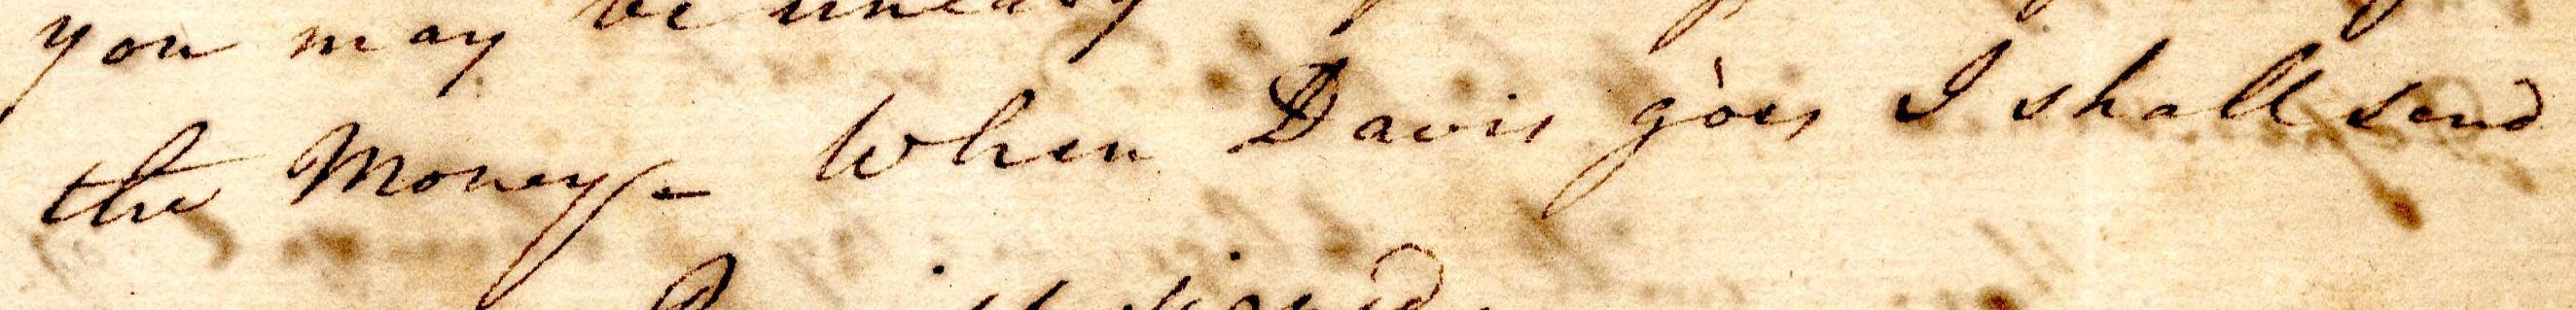the Money- When Davis goes I shall send
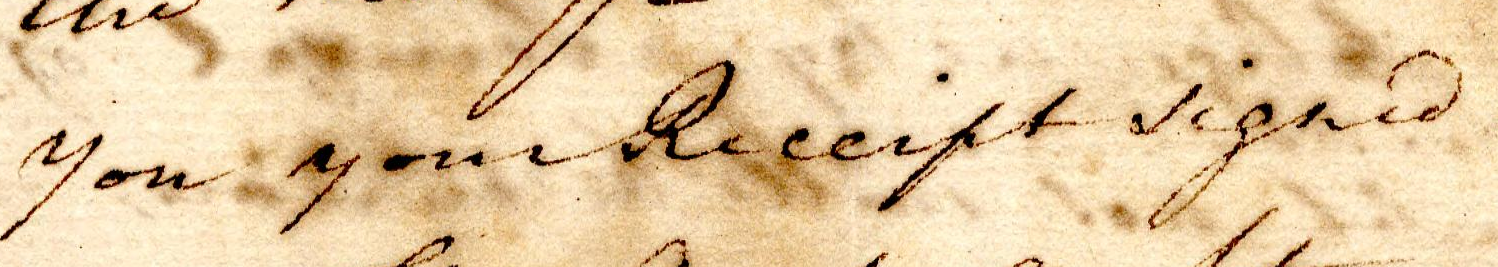you your Receipt signed.
